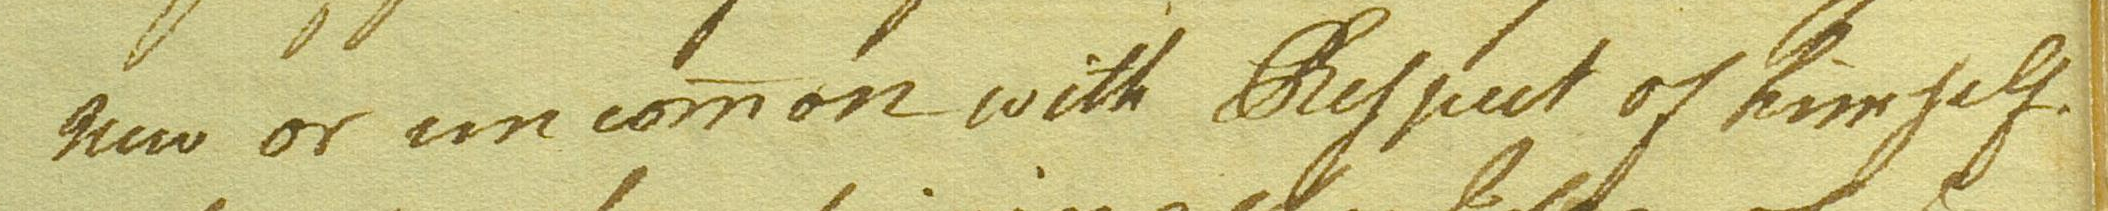new or uncom̄on with Respect of himself.
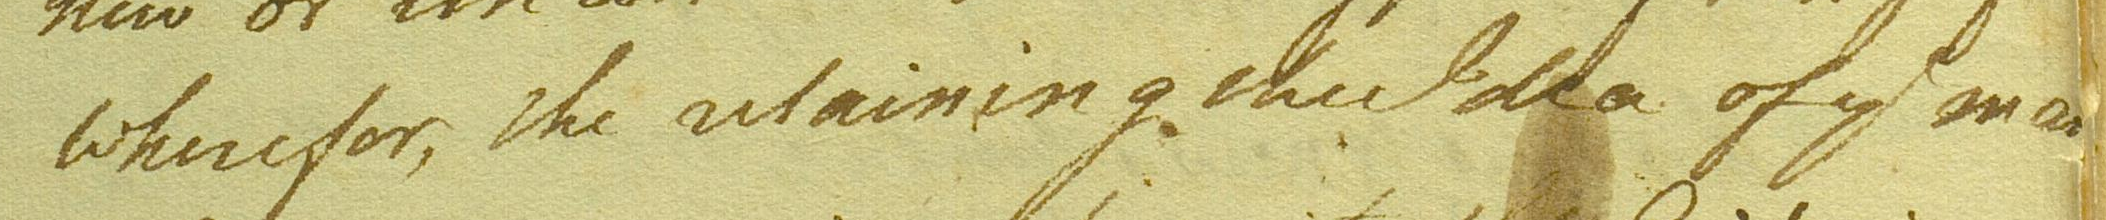Wherefor, the retaining the Idea of y^e mar
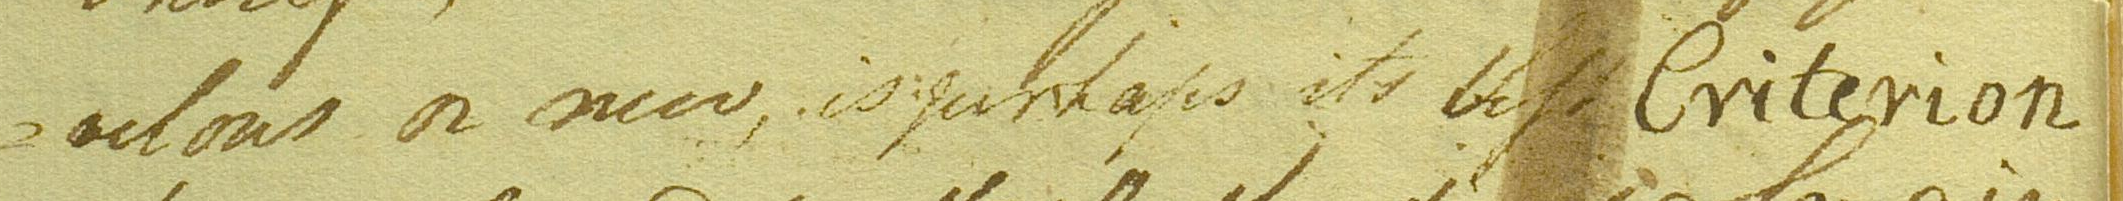velous or new, is perhaps its best Criterion
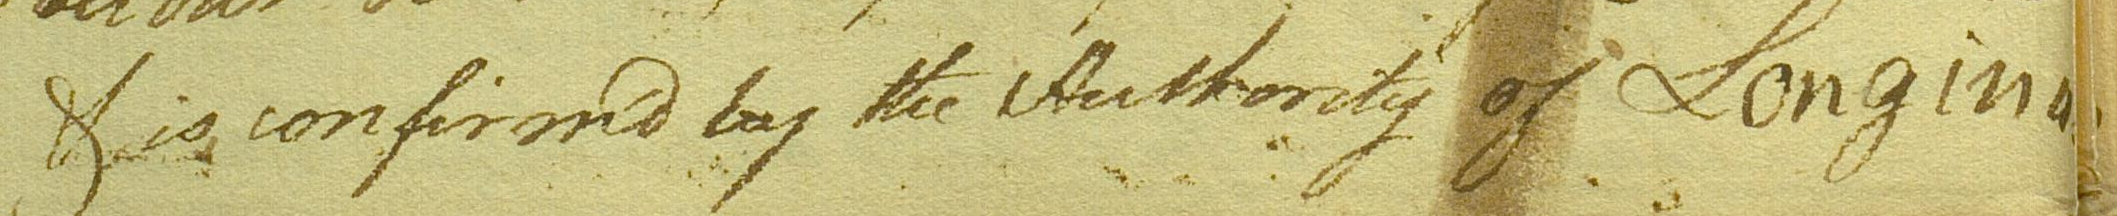& is confirm'd by the Authority of Longinus
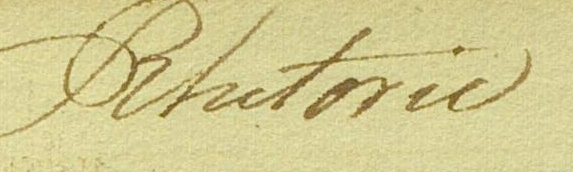Rhetoric
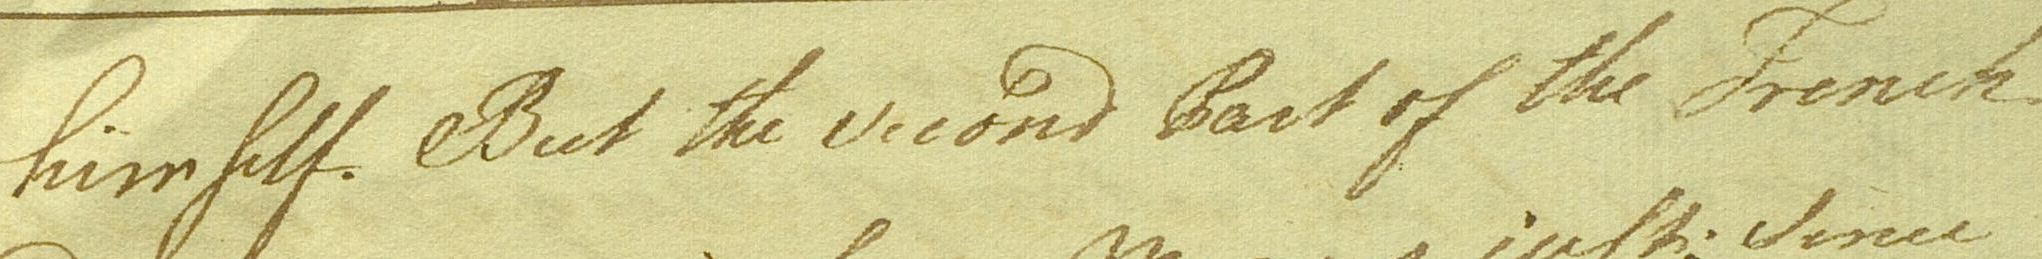himself. But the second Part of the French
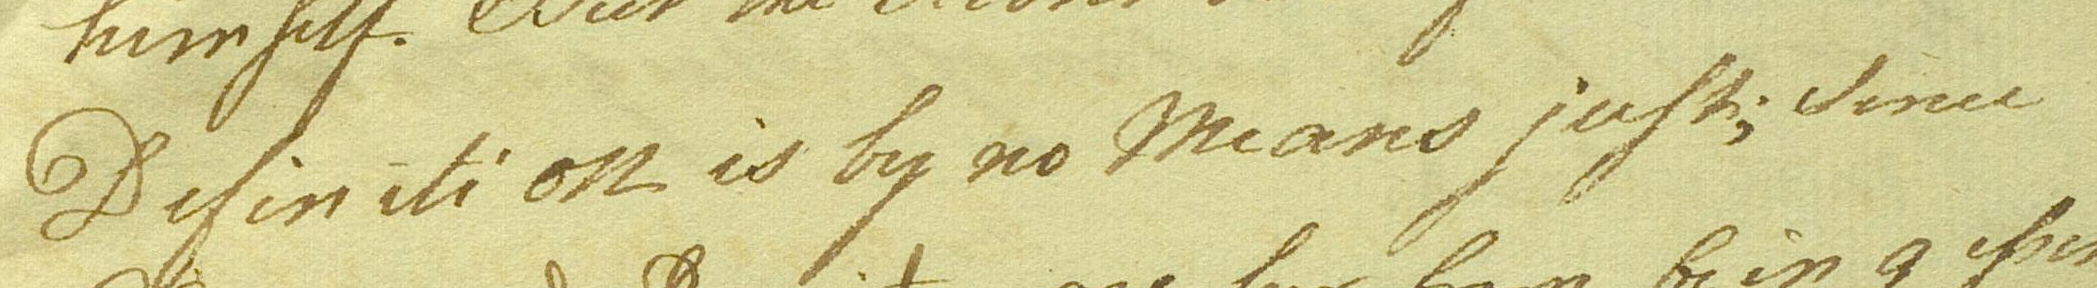Definition is by no Means just; since
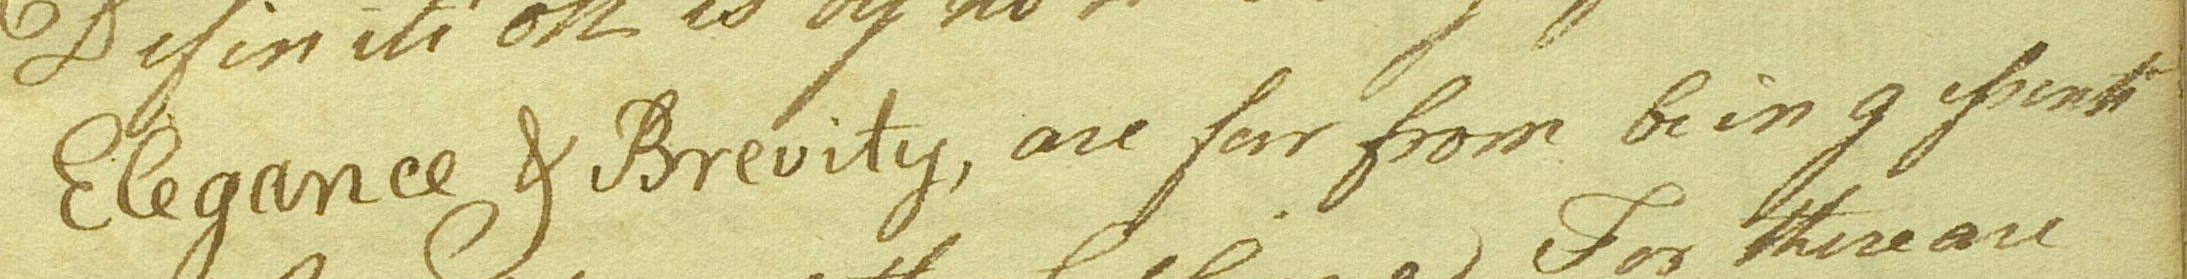Elegance & Brevity, are for from being essenti
